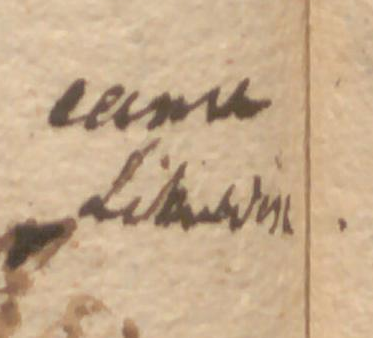Likewise
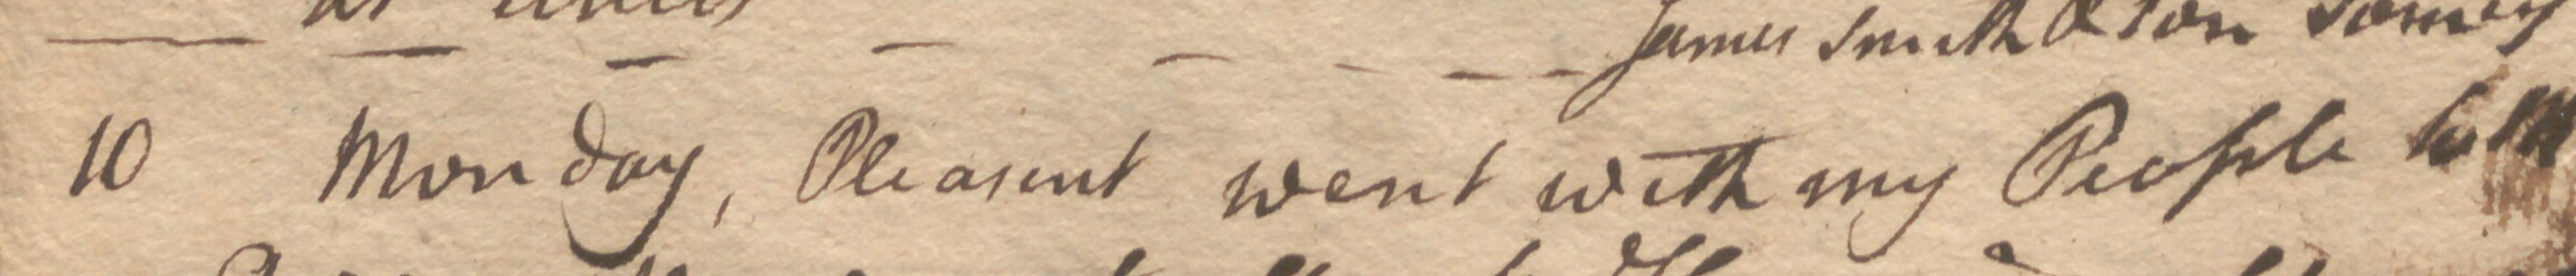10 Monday, Pleasent went with my People to
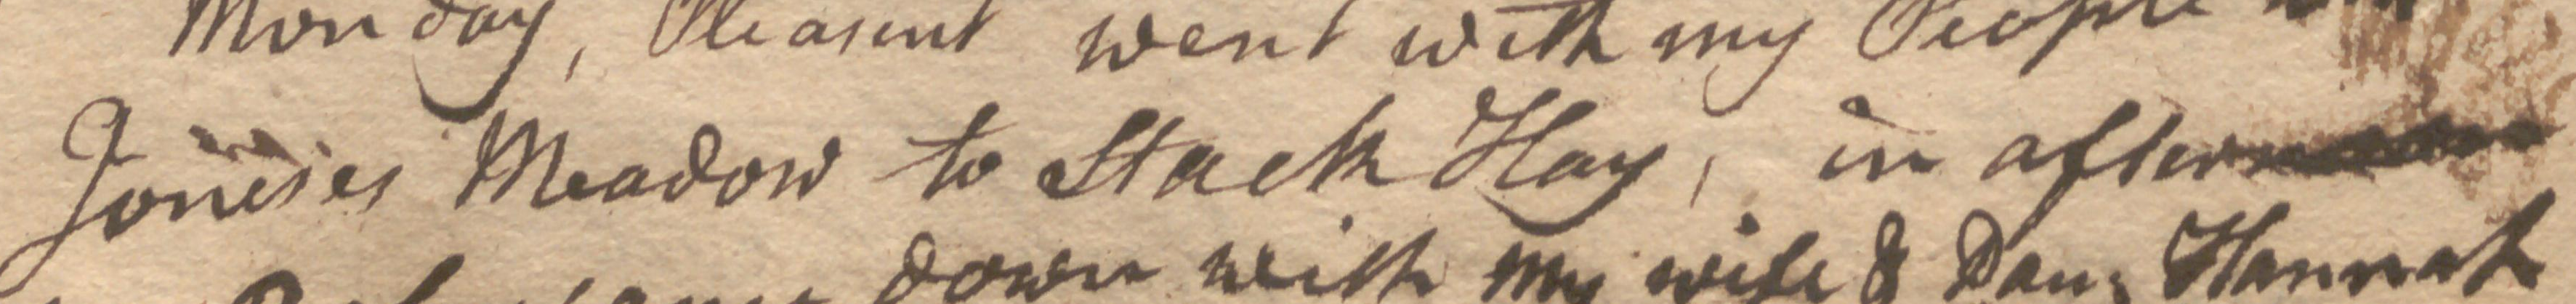Joneses Meadow to Stack Hay, in afternoon
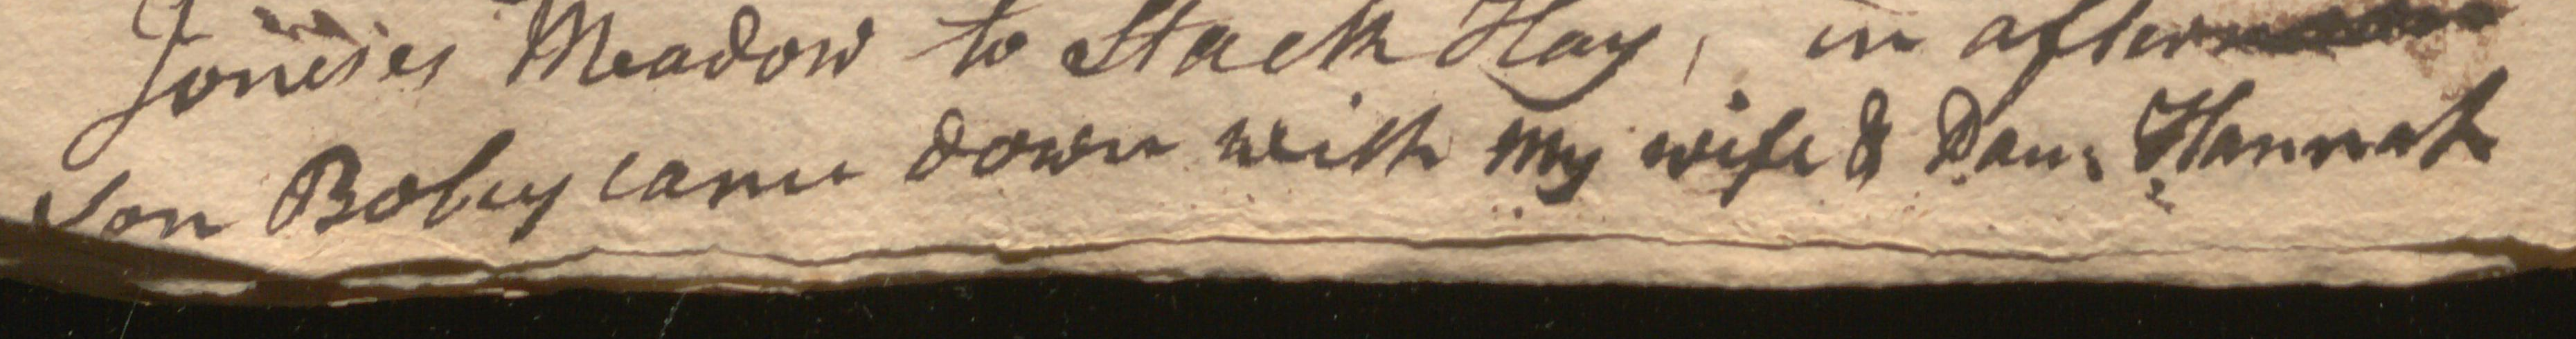Son Bobey came down with my wife Dau. Hannah
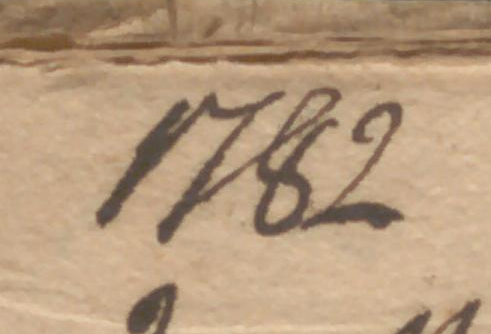1782
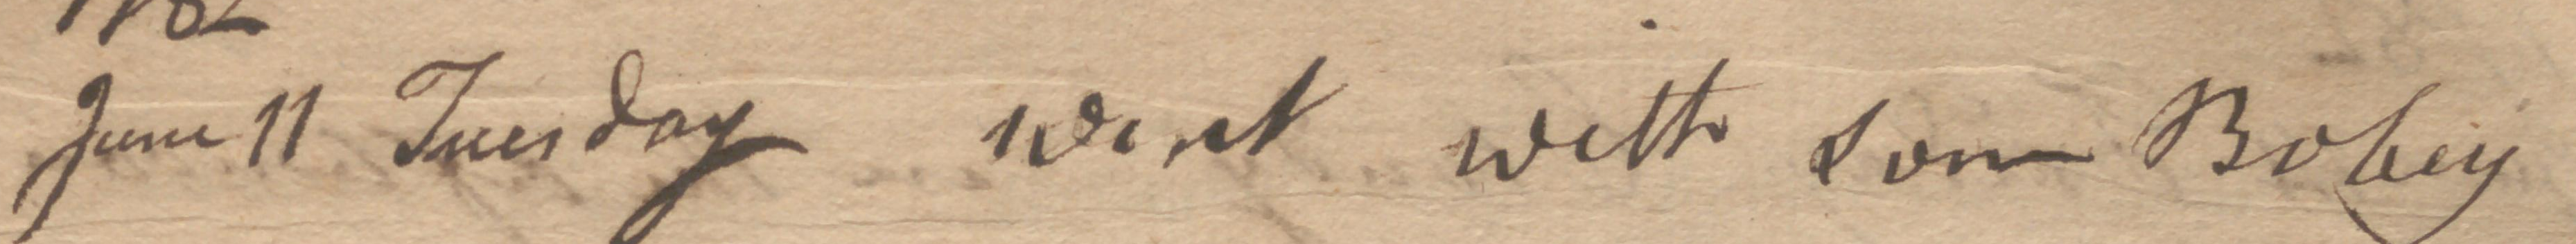June 11 Tuesday went with son Bobey
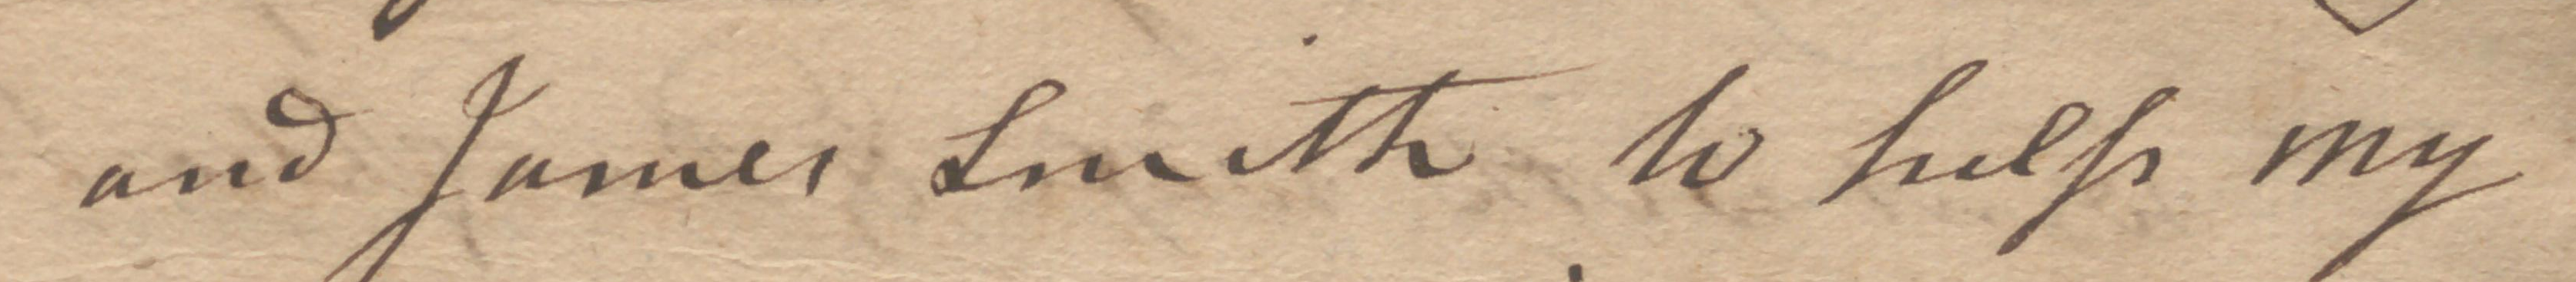and James Smith to help my
